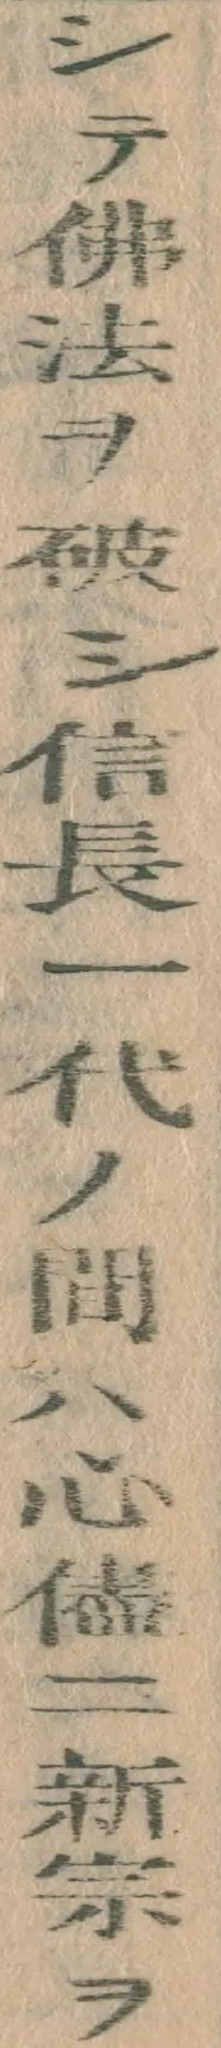シテ仏法ヲ破シ信長一代ノ間ハ心儘ニ新宗ヲ
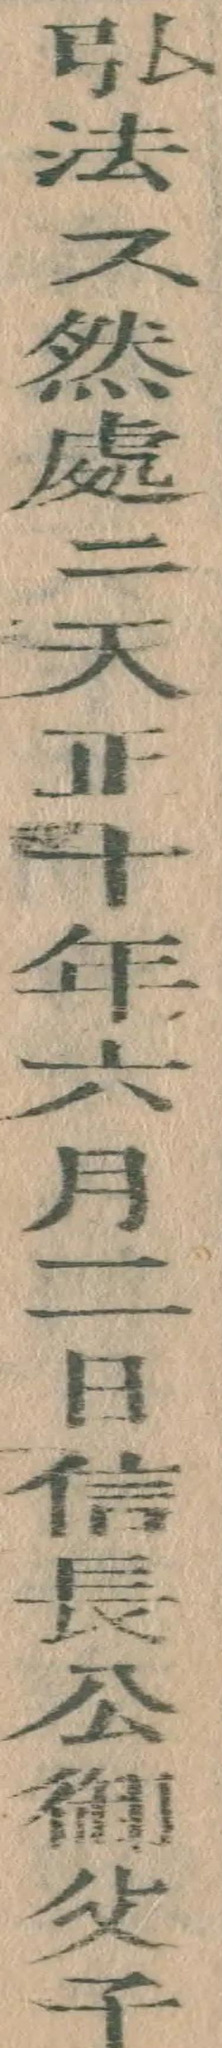弘法ス然処ニ天正十年六月二日信長公御父子
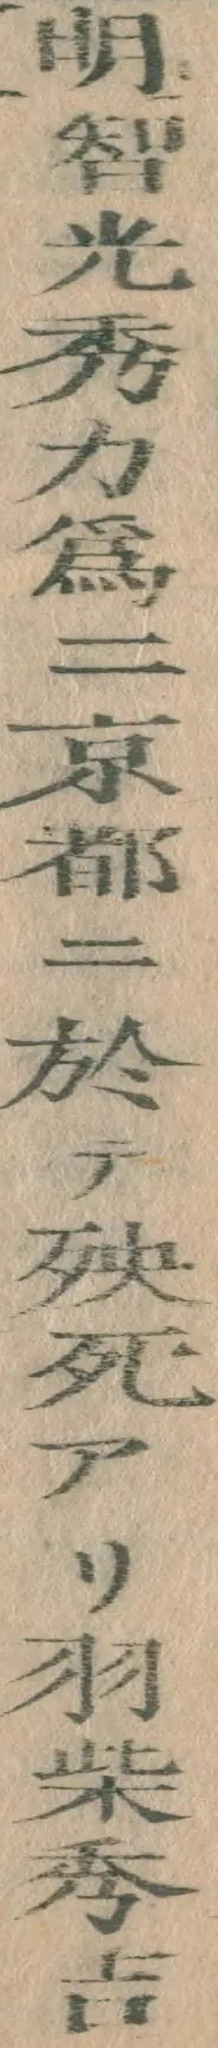明智光秀カ為ニ京都ニ於テ殃死アリ羽柴秀吉
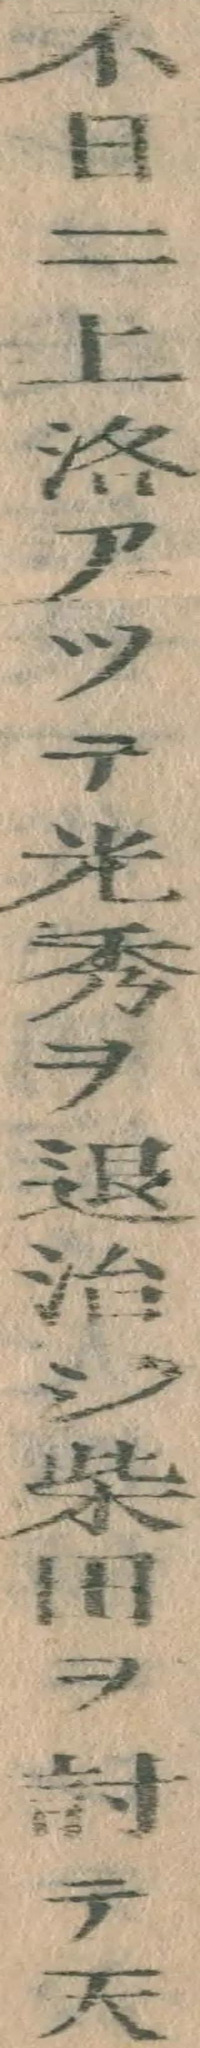不日ニ上洛アツテ光秀ヲ退治シ柴田ヲ討テ天
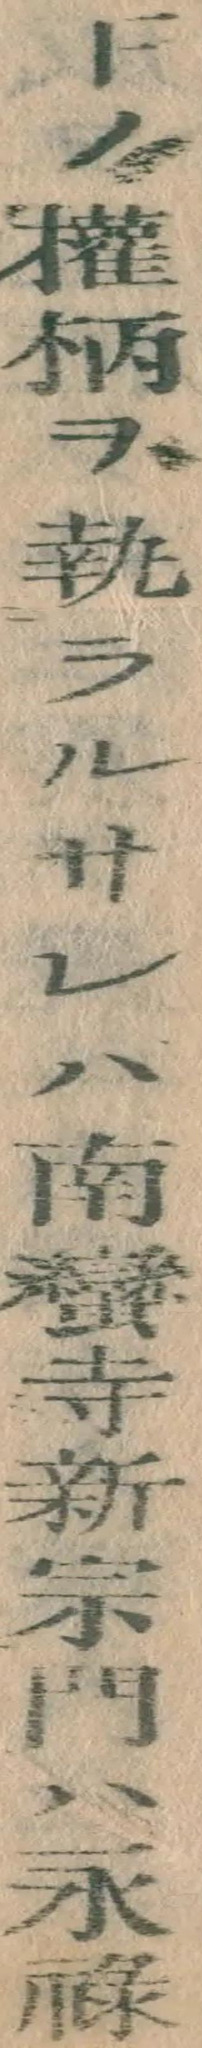下ノ権柄ヲ執ラルサレハ南蛮寺新宗門ハ永禄
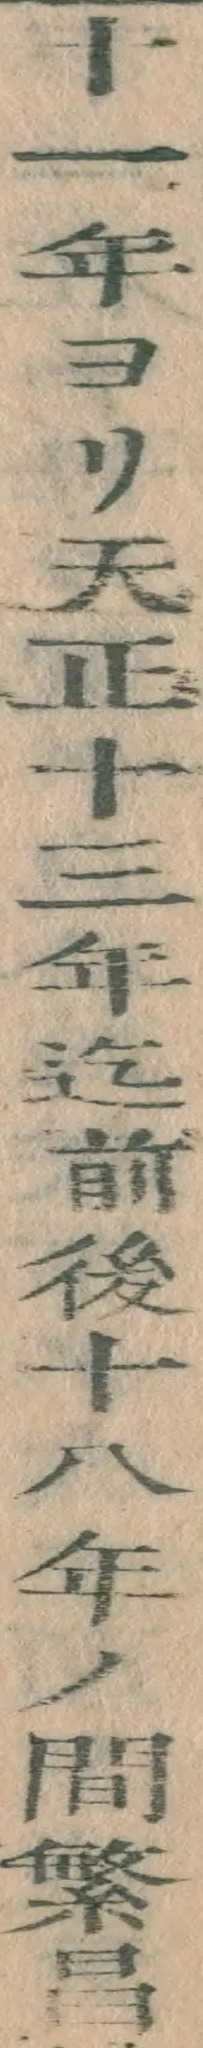十一年ヨリ天正十三年迄前後十八年ノ間繁昌
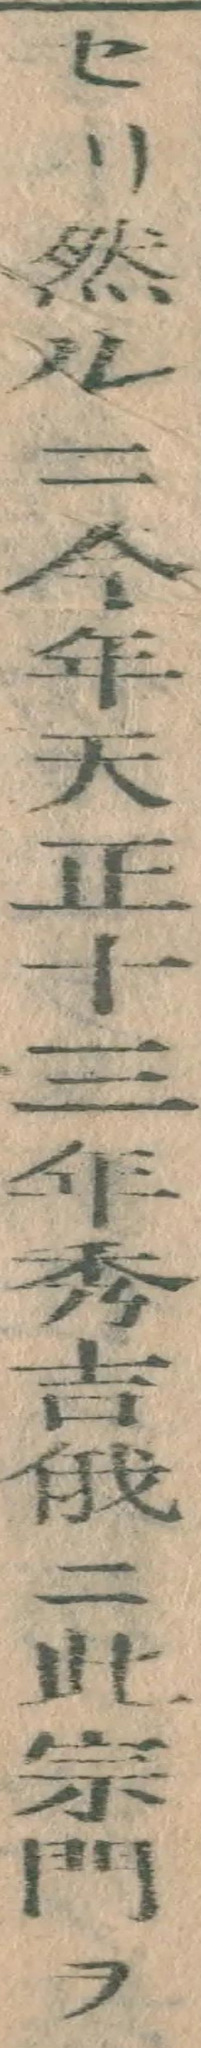セリ然ルニ今年天正十三年秀吉俄ニ此宗門ヲ

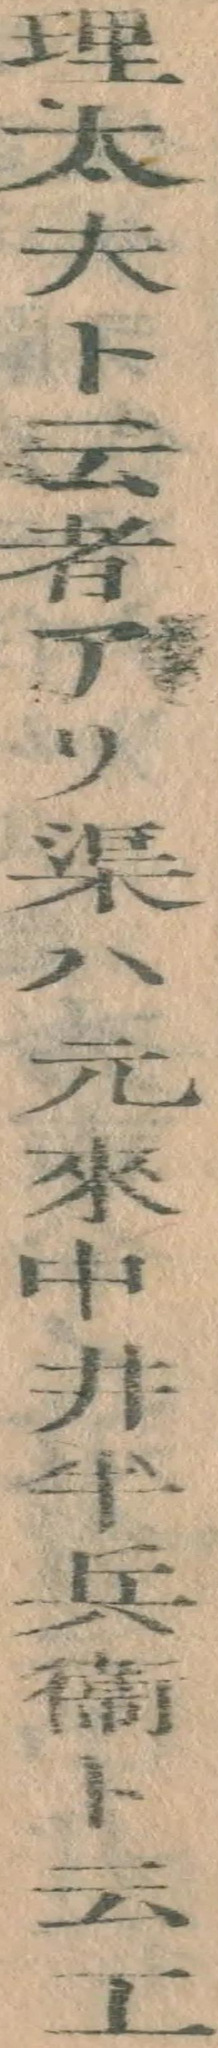理太夫ト云者アリ渠ハ元来中井半兵衛ト云工
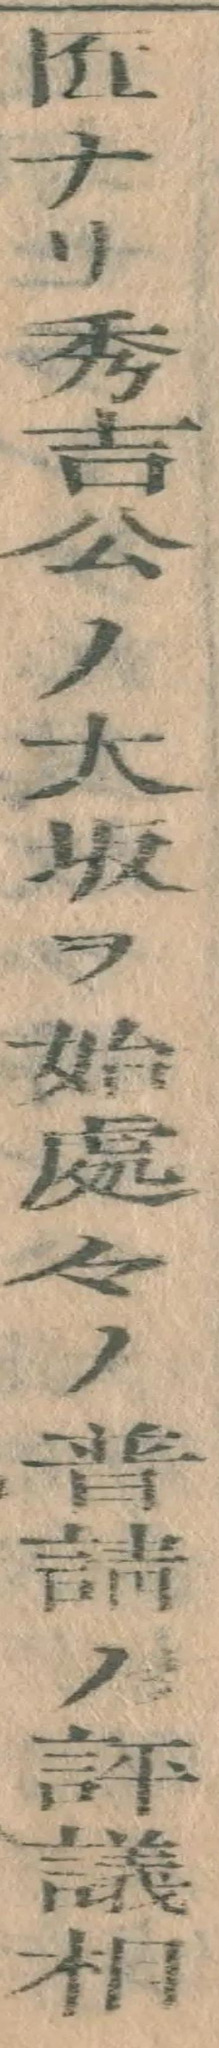匠ナリ秀吉公ノ大坂ヲ始処々ノ普請ノ評議相
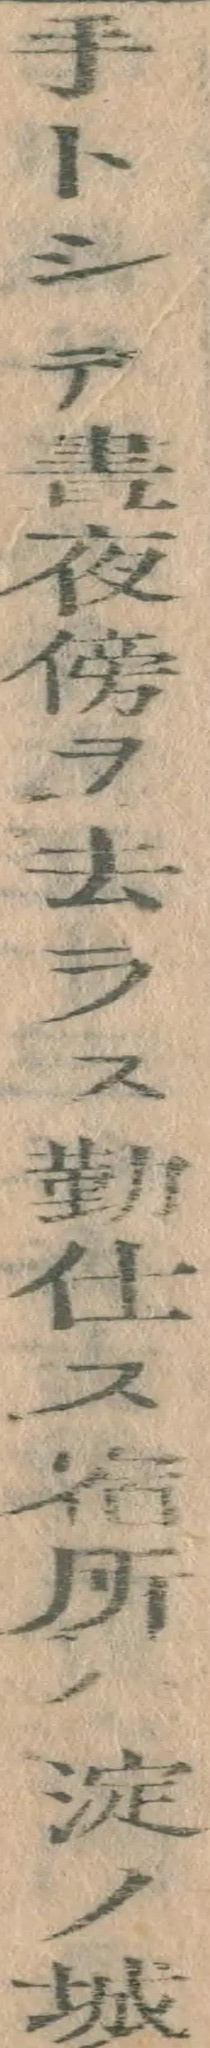手トシテ昼夜傍ヲ去ラス勤仕ス宿所ハ淀ノ城
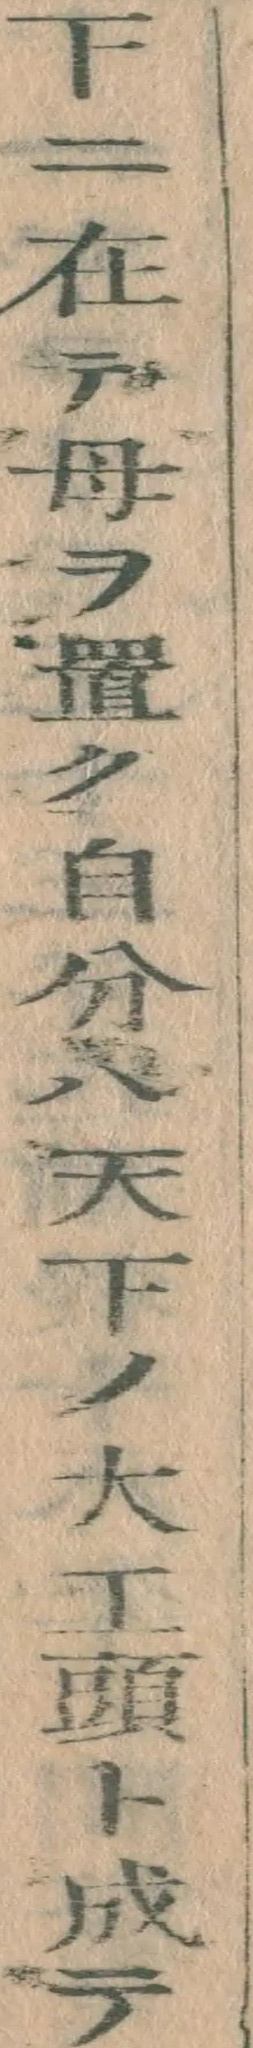下ニ在テ母ヲ置ク自分ハ天下ノ大工頭ト成テ
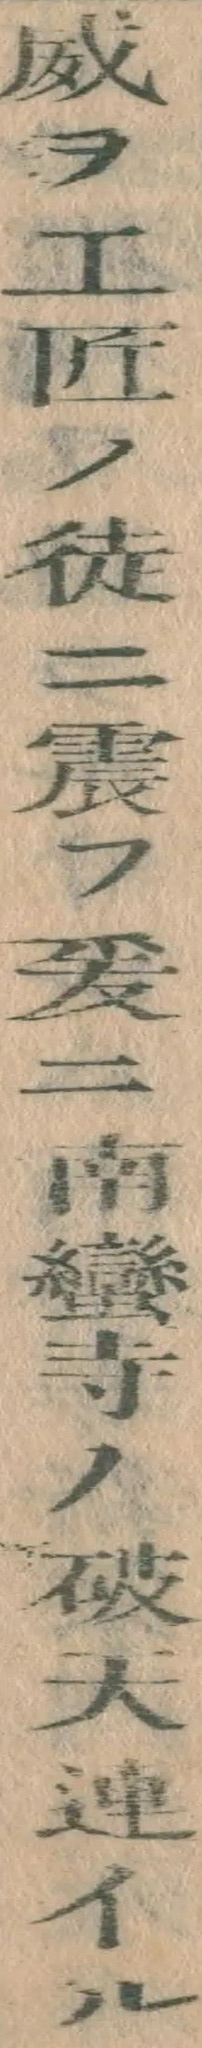威ヲ工匠ノ徒ニ震フ爰ニ南蛮寺ノ破天連イル
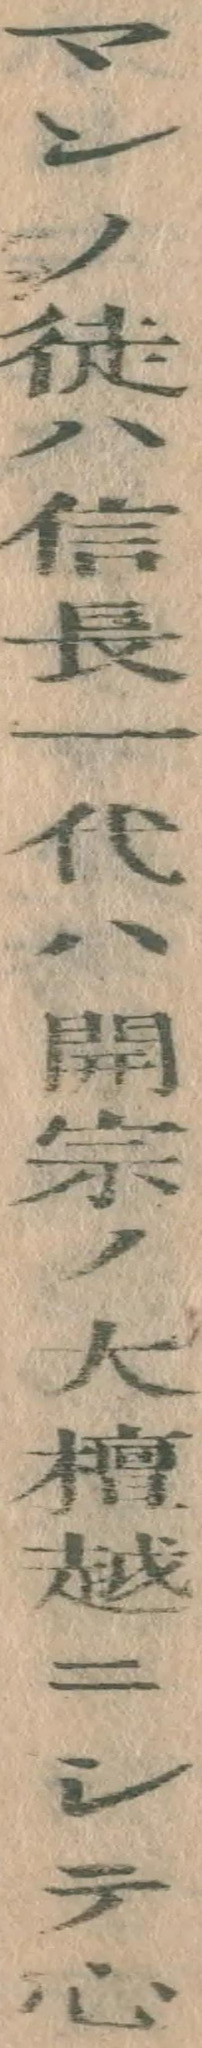マンノ徒ハ信長一代ハ開宗ノ大檀越ニシテ心
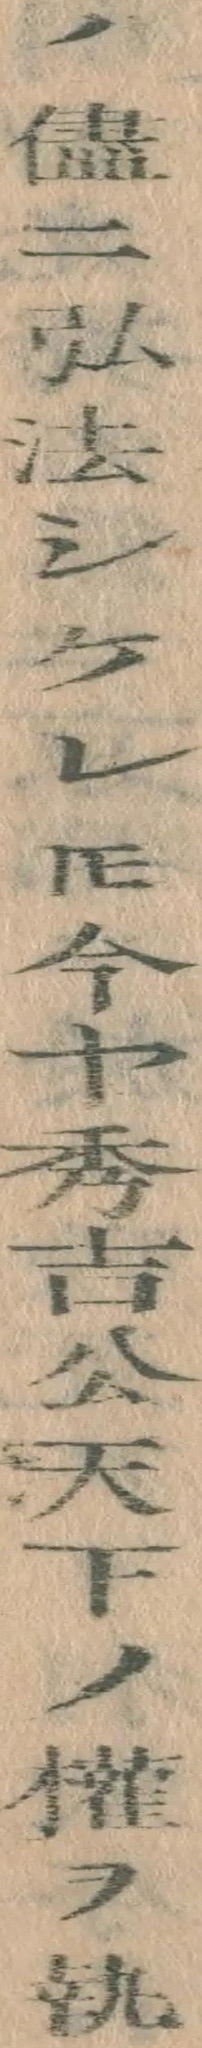儘ニ弘法シケレトモ今ヤ秀吉公天下ノ権ヲ執
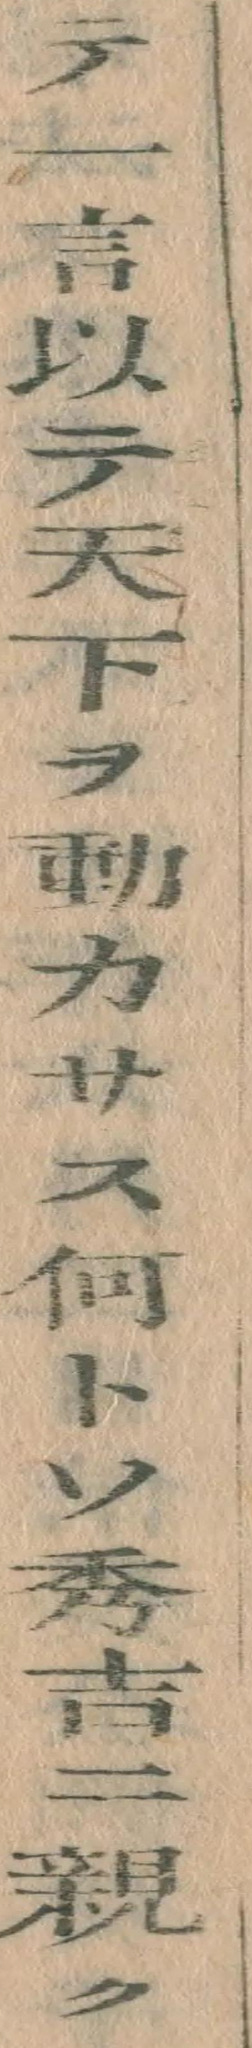テ一言以テ天下ヲ動カサス何トソ秀吉ニ親ク
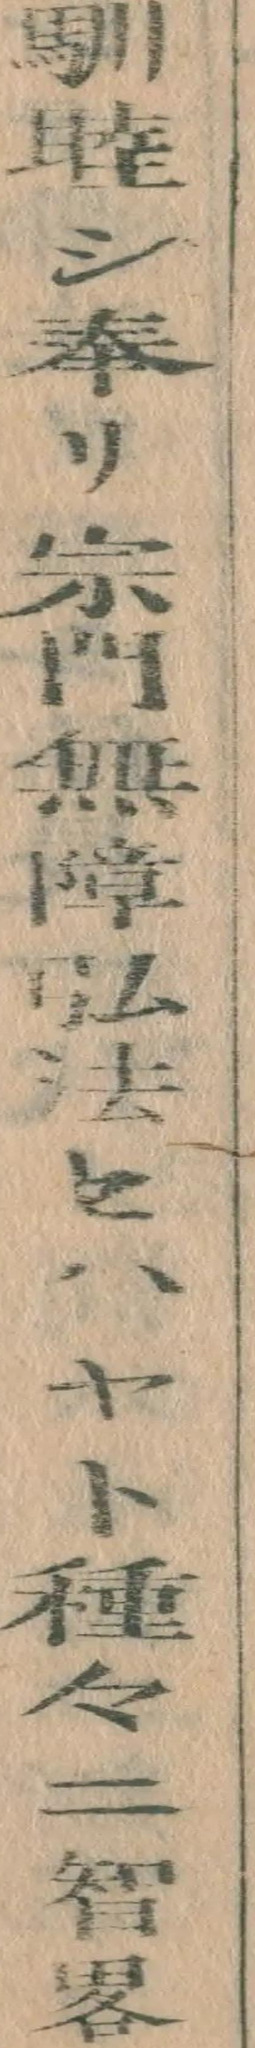馴睦シ奉リ宗門無障弘法セハヤト種々ニ智略
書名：南蛮寺興廃記
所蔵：国立国会図書館 National Diet Library, JAPAN
